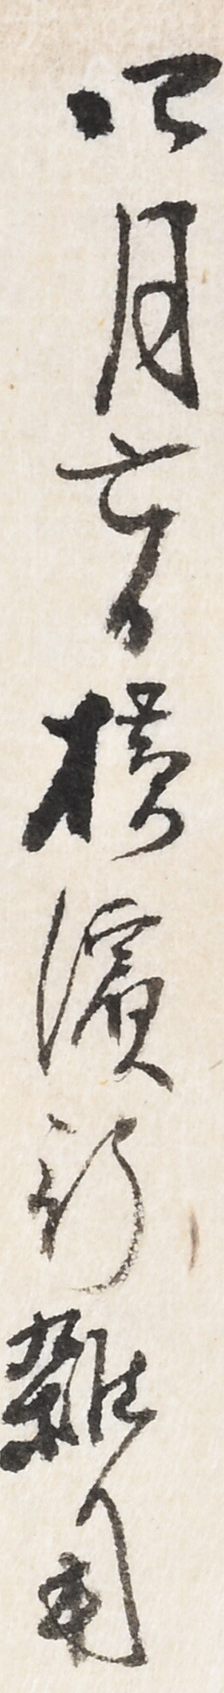四月七日行横浜新雑用
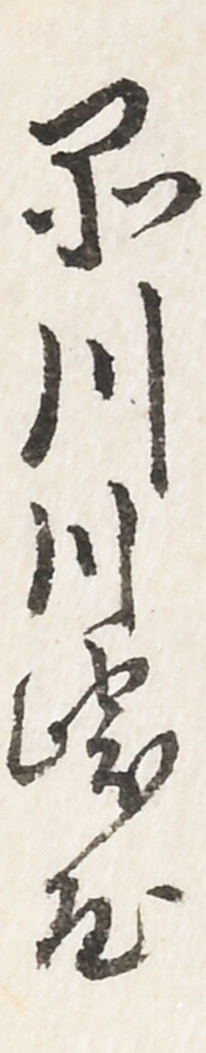品川川崎屋
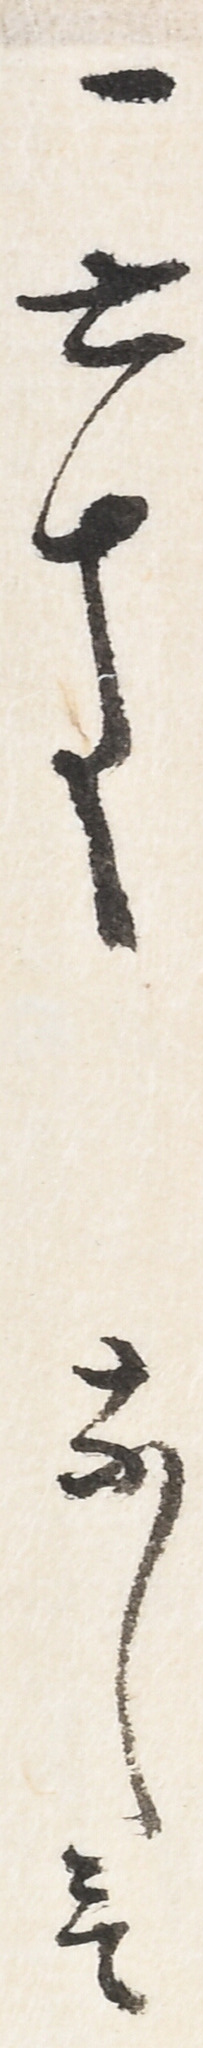一六十文よしニて
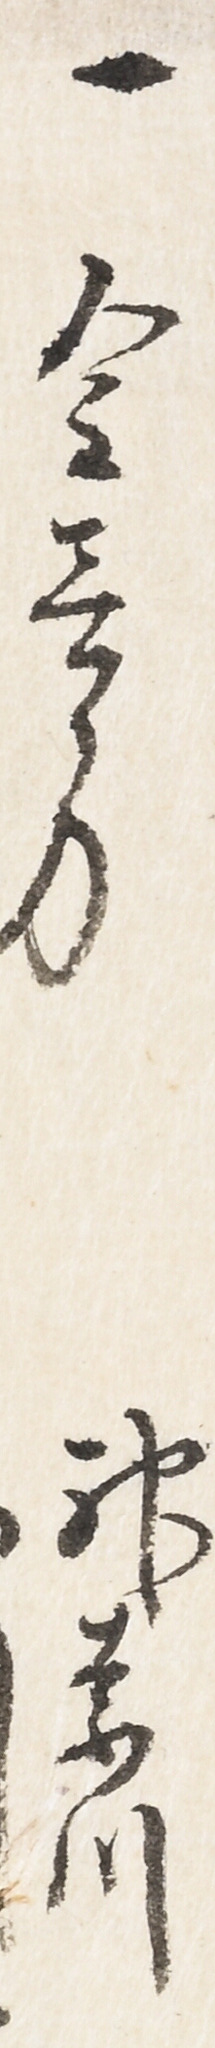一金壱分神奈川
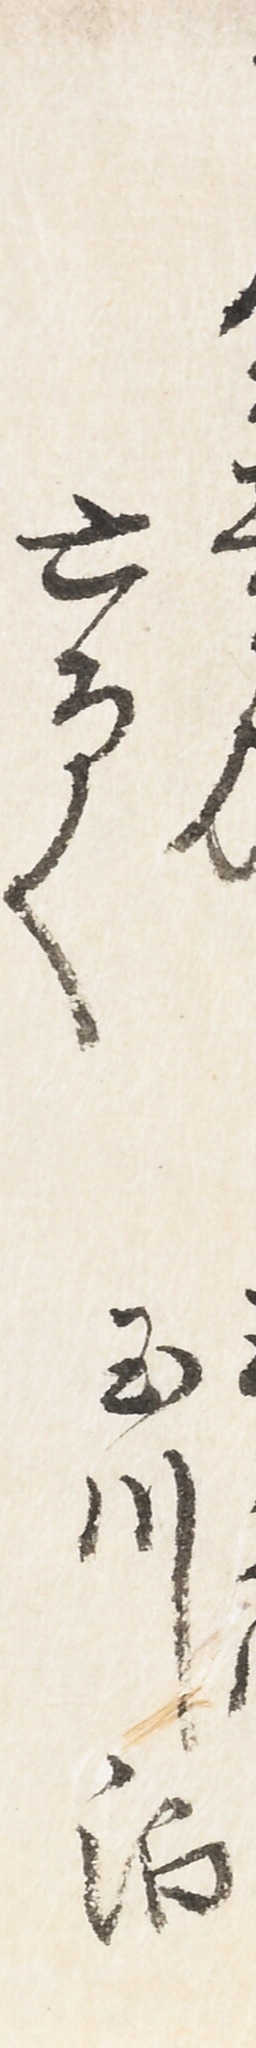六百文玉川泊
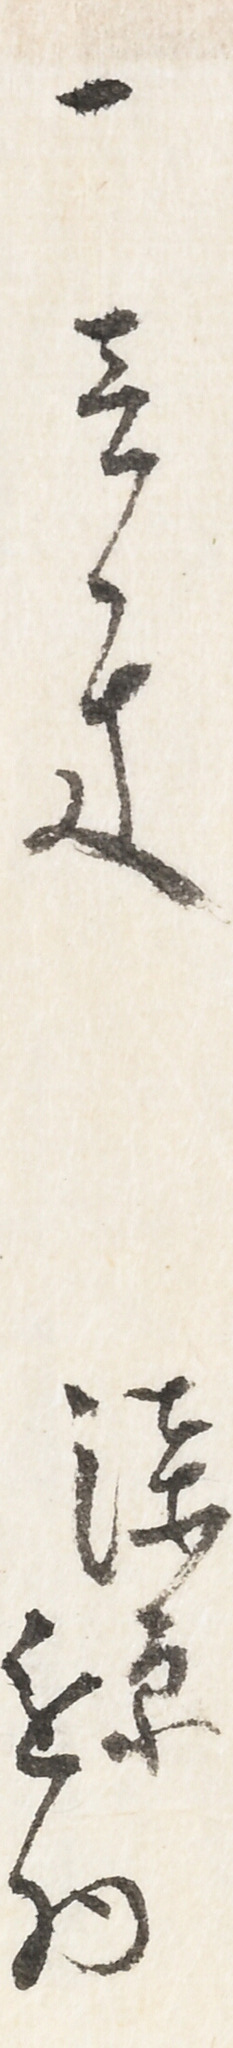一壱疋漆原村
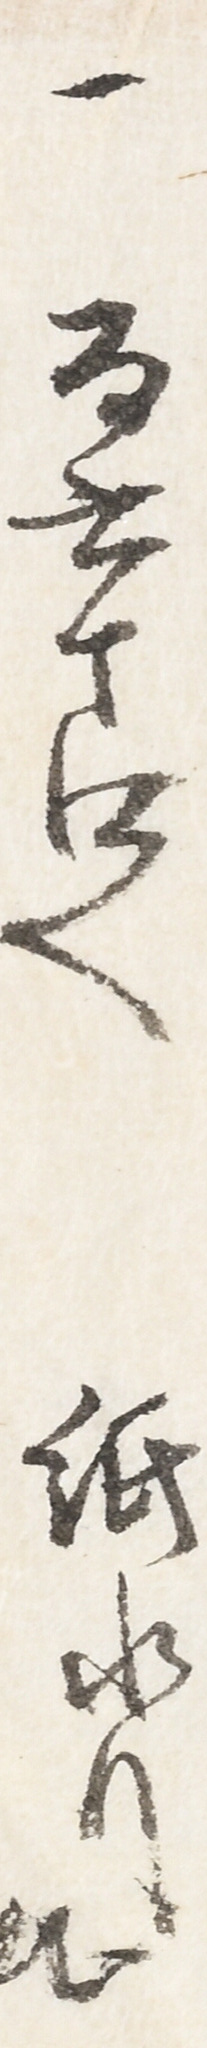一百六十四文紙水引之屋

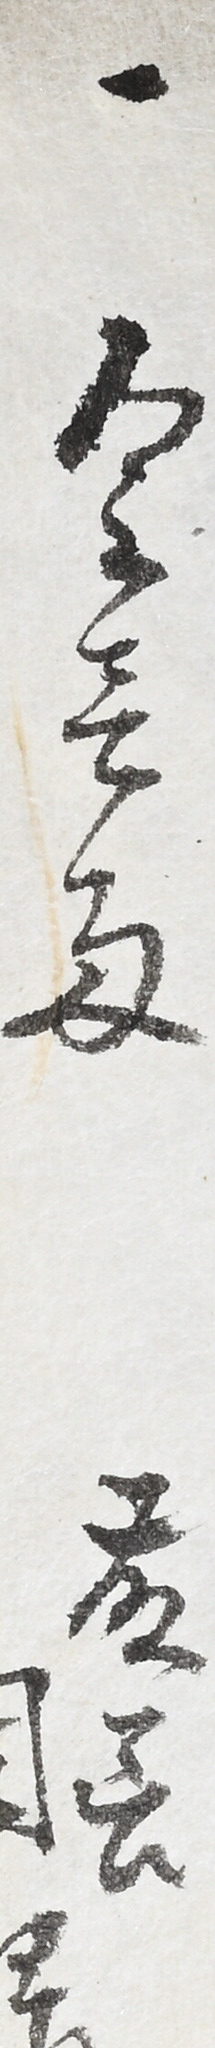一金壱両目録
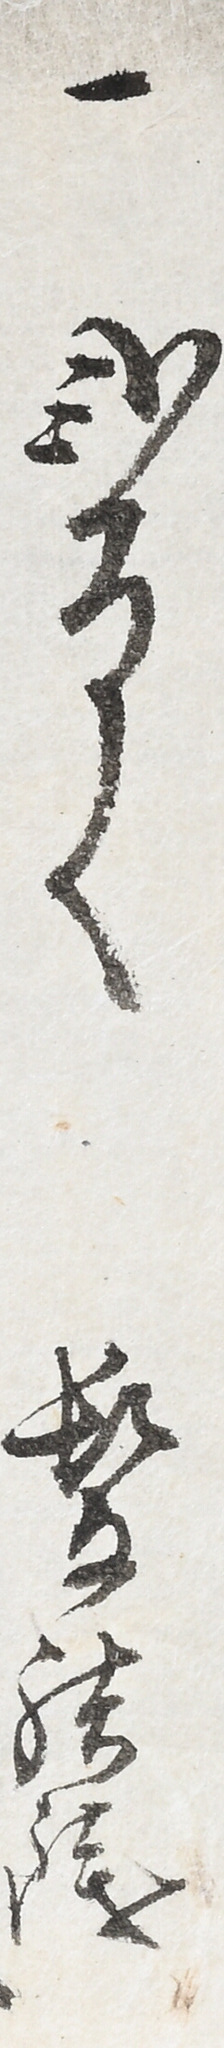一弐百人髪結銭
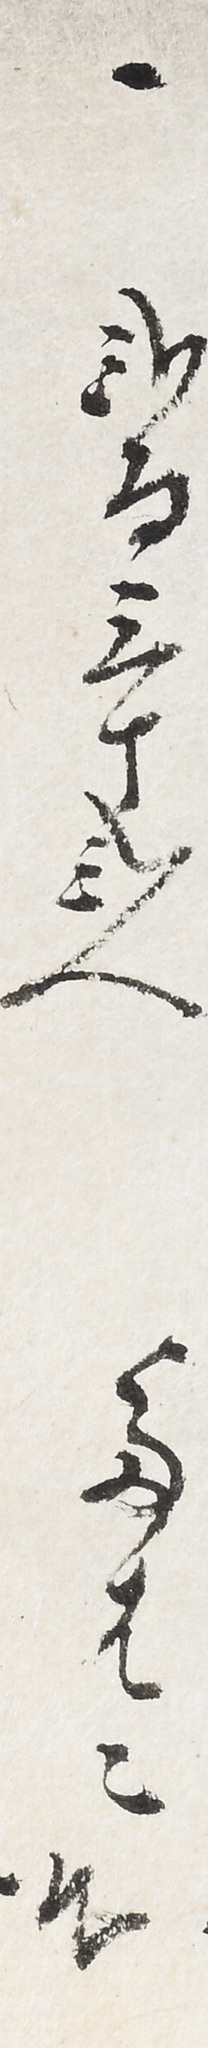一弐百三十弐文たはこ屋
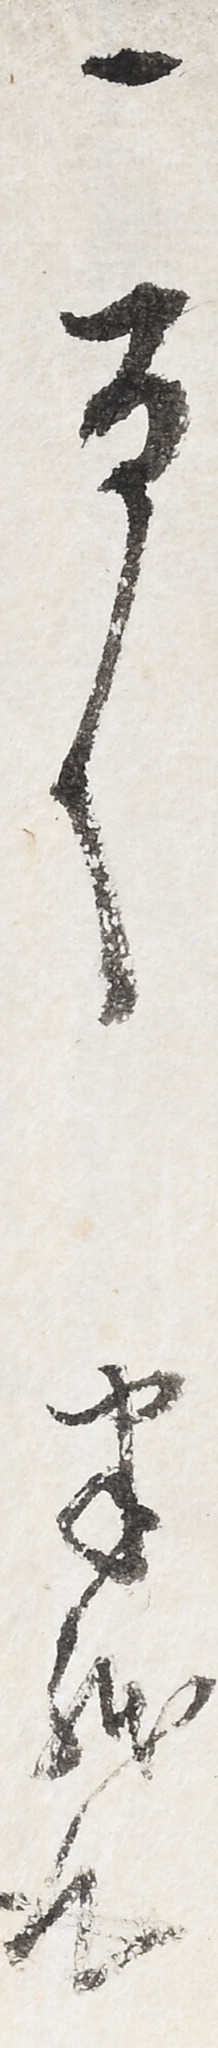一百文半紙屋
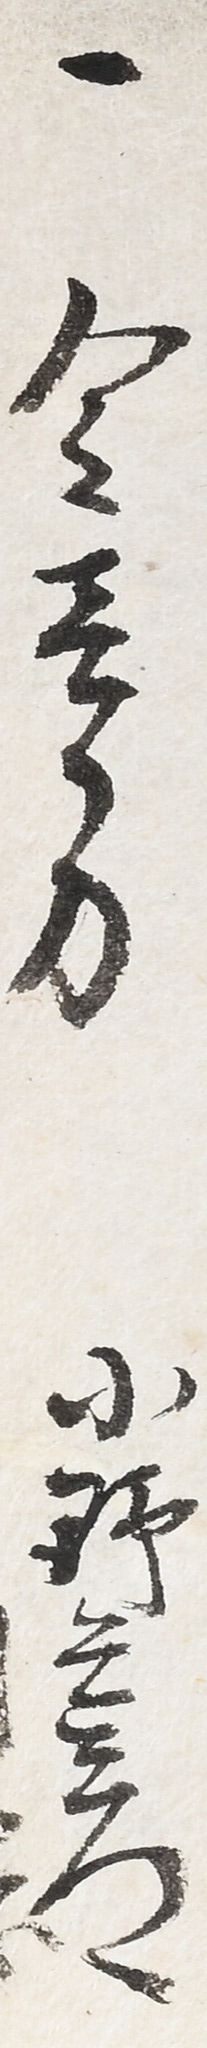一金壱分小野兵右衛門
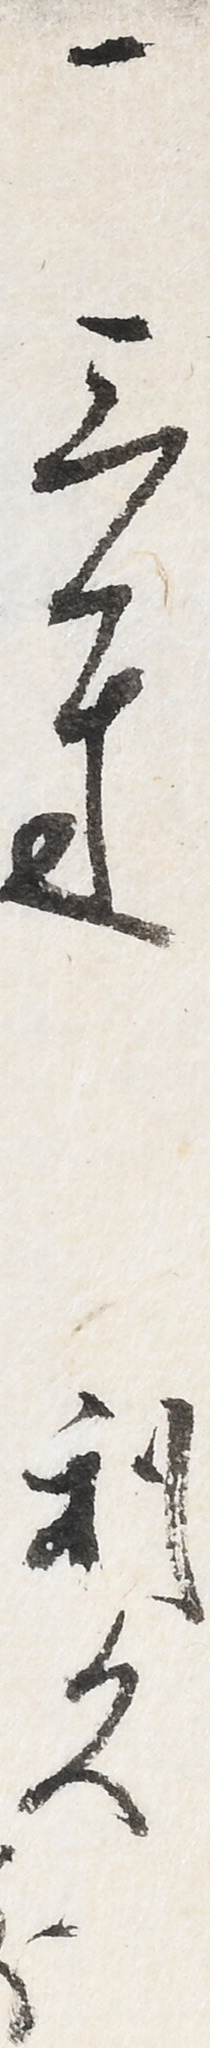一三疋利久屋
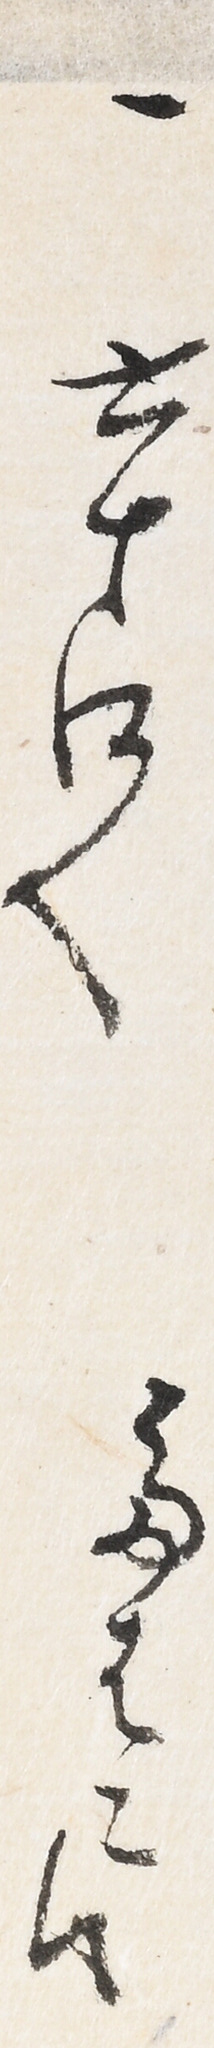一六十四文たはこ屋
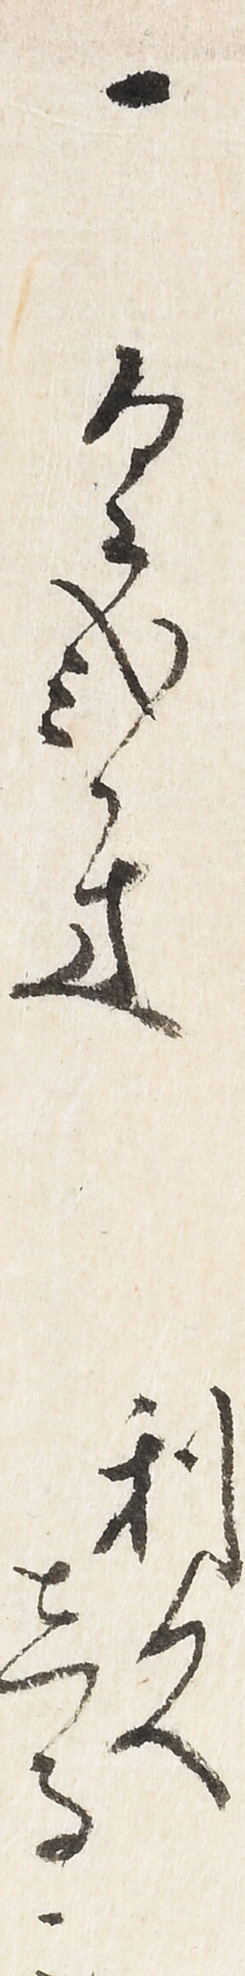一金弐朱利久
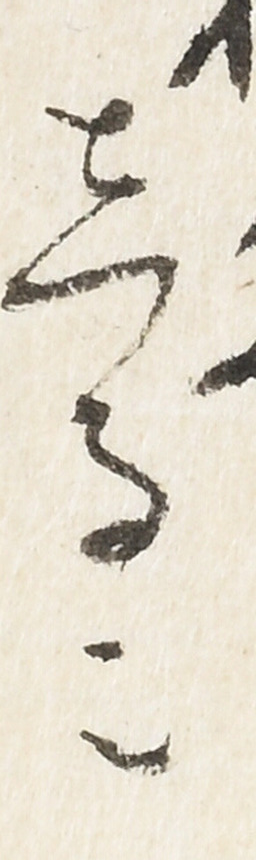しるこ
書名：御上屋鋪逗留中雑用控
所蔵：伊那市立高遠町図書館・合同会社AMANE
